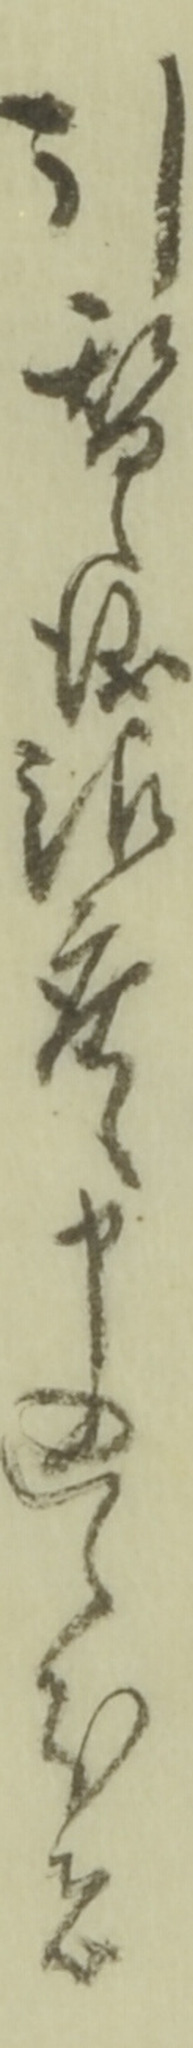引替候儀銀座へ申込候分者
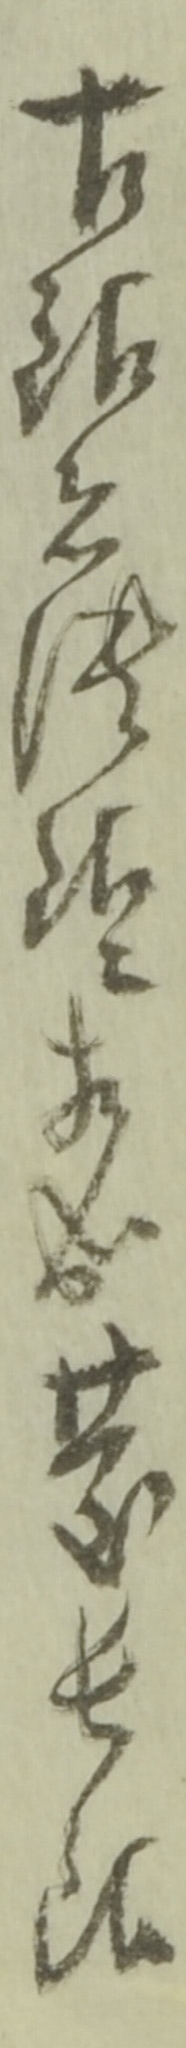古銀者潰銀二相成慶長銀

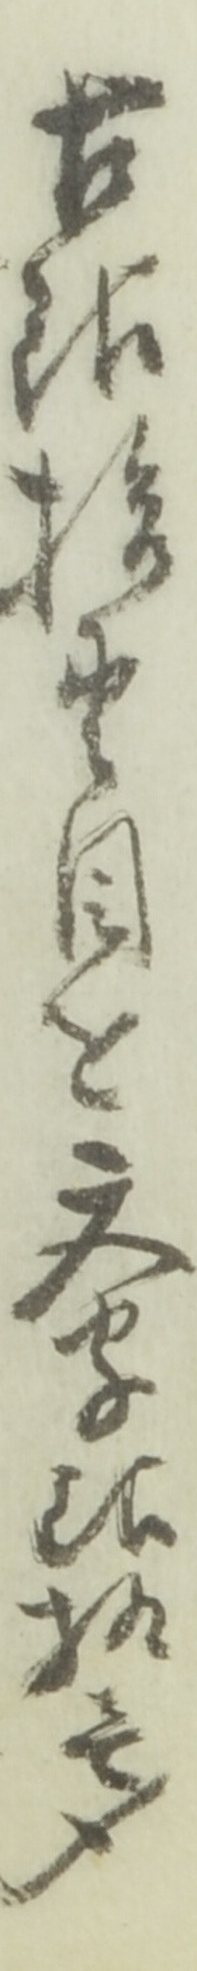古銀拾貫目を文字銀拾壱〆
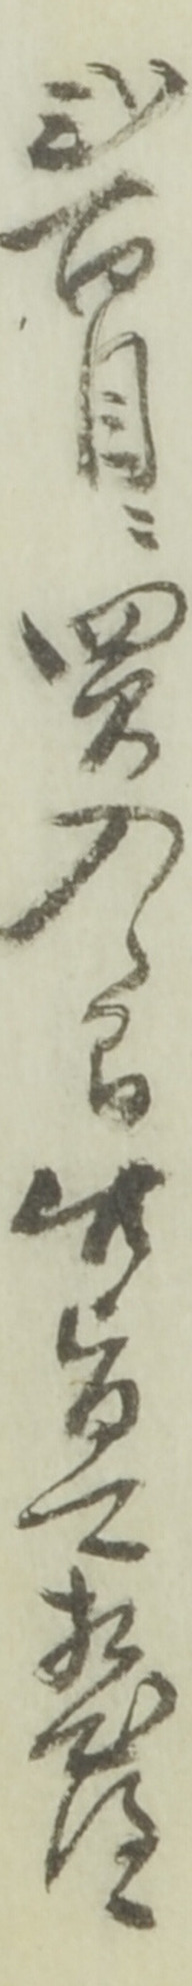弐百目二買入候間此旨か相心得
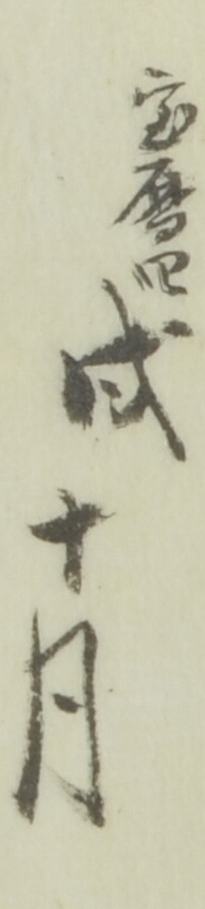宝暦四戌十月
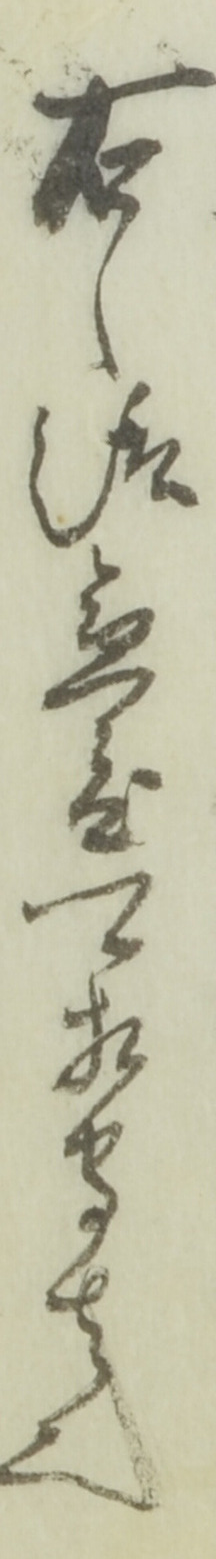右の仰急度可相守る者也
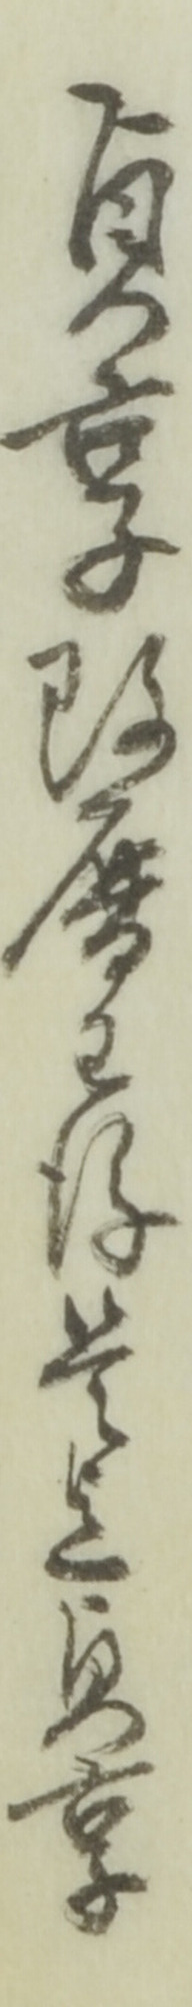貞享改暦以後是迄貞享
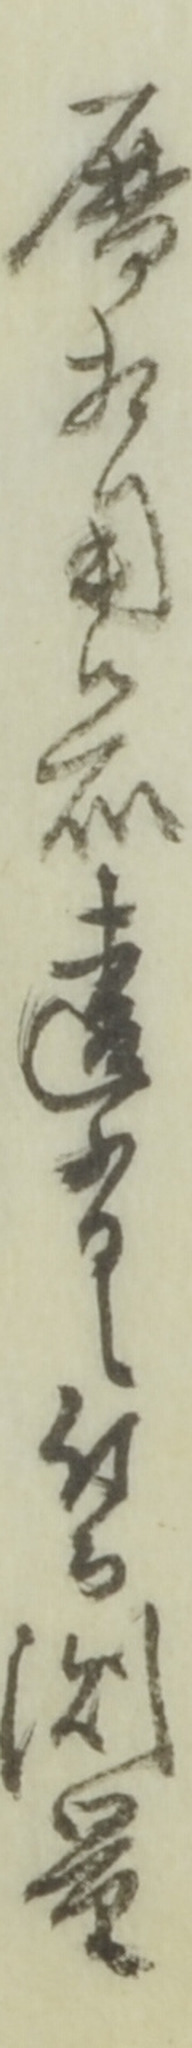暦相用候処違有之候付而測量
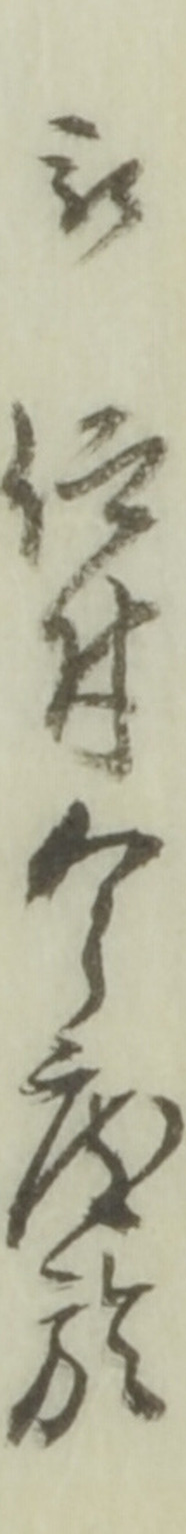被仰付今度於
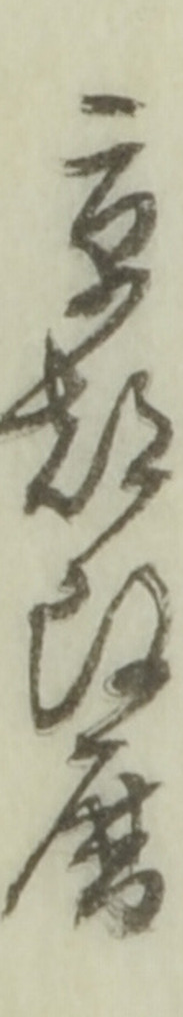京都改暦
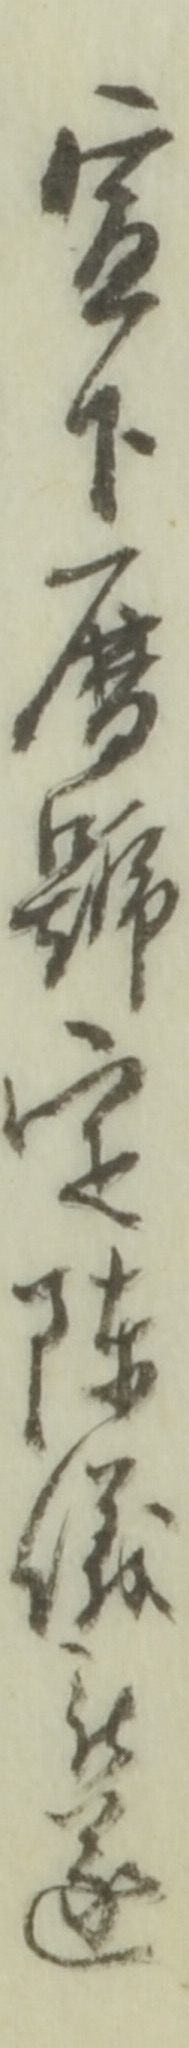宣下歴号定陳儀被遂
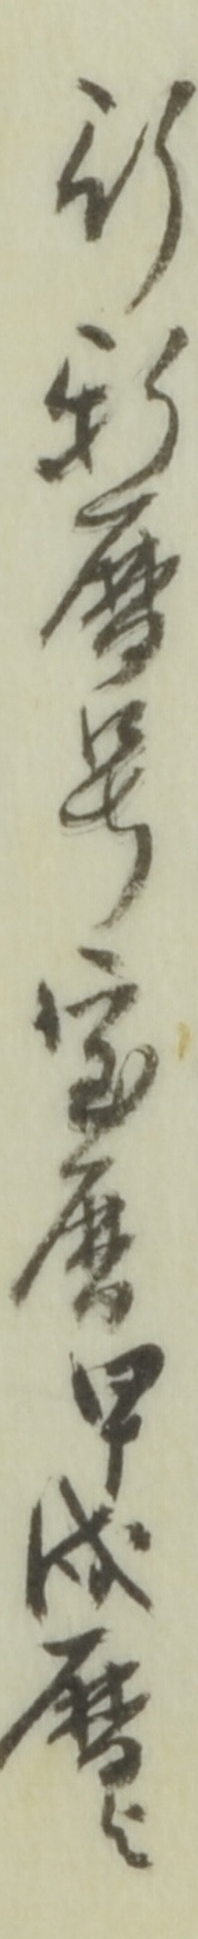行新暦号宝暦甲戌歴と
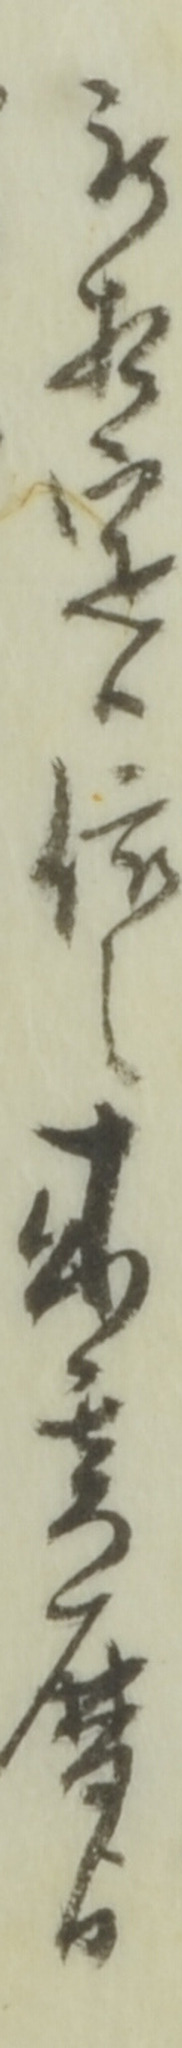被相定候依之来歴より
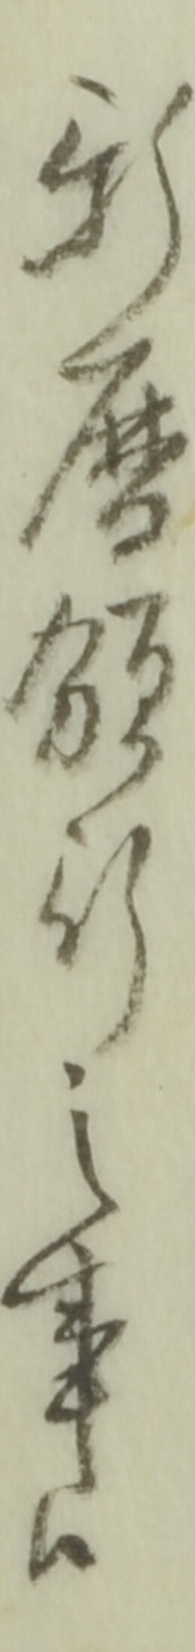新暦頒行の事候
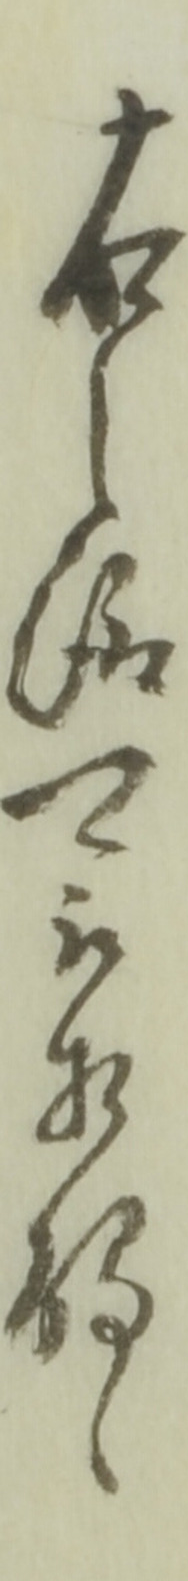右之趣可被相触候
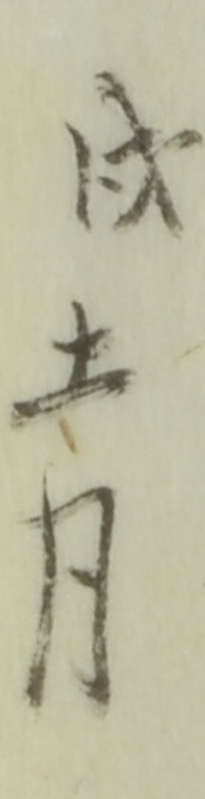戌十一月
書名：御公儀様御領主様御触書控
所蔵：伊那市立高遠町図書館・合同会社AMANE
